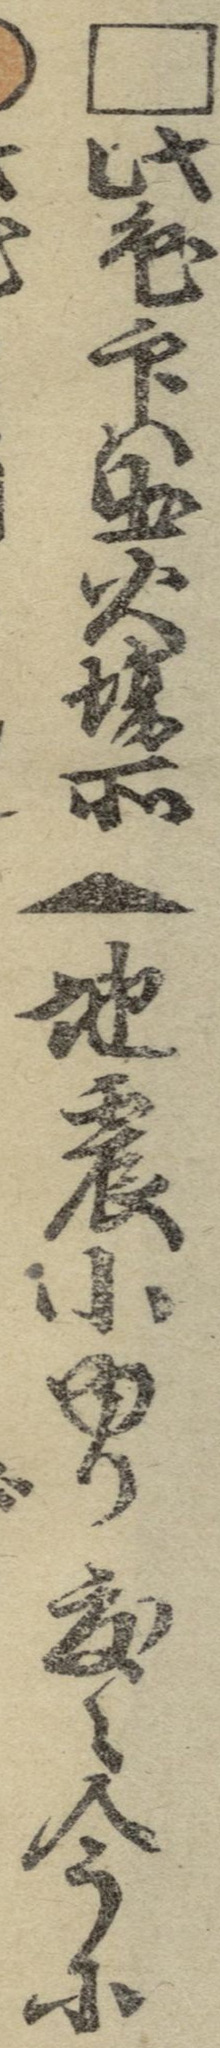口此色印は出火場所▲地震小ゆり度々今に
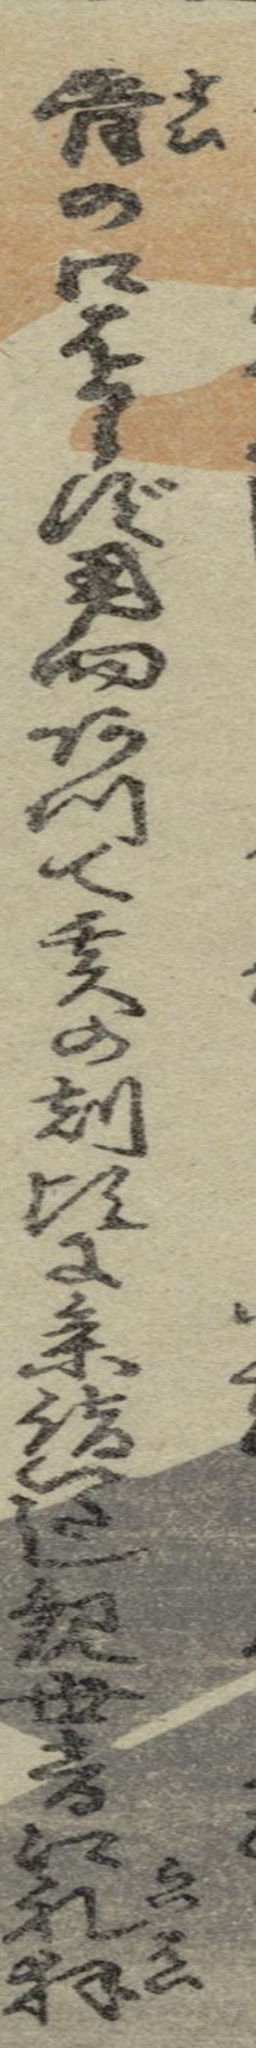宵の口はからず用向あつて亥の刻頃に参詣いたし観音に礼拝
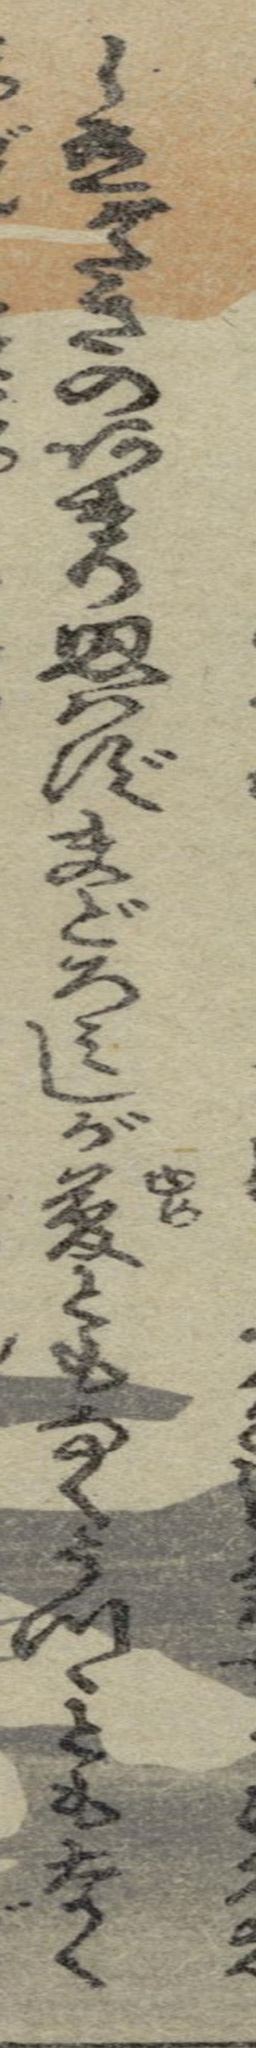し有がたきのあまり思はずまどろみしが夢ともなくうつゝともなく
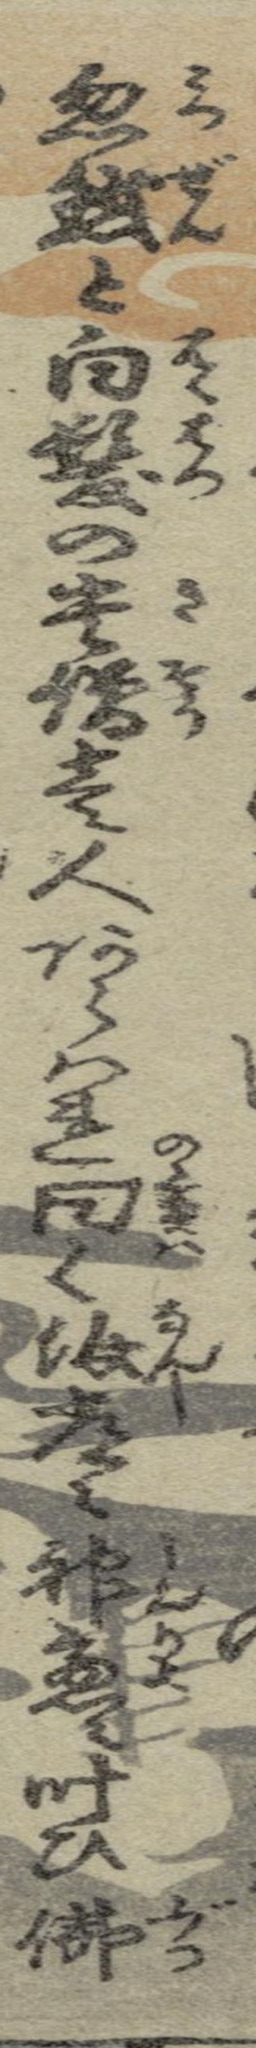忽然と白髪の貴僧壱人あらはれ曰く汝常々神慮に叫ひ仏
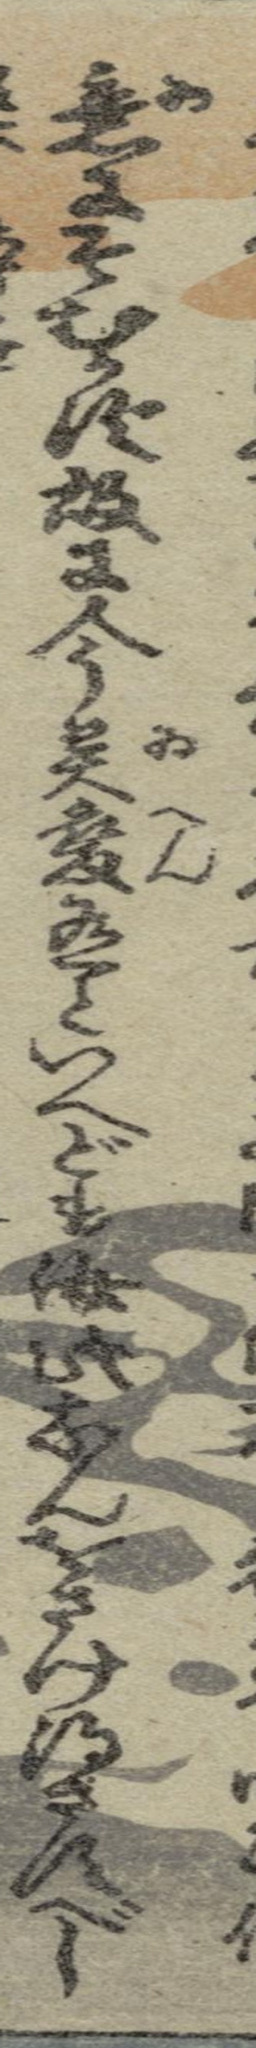意にそむかず故に今異変有といへども汝此なんをさけ得さすべし
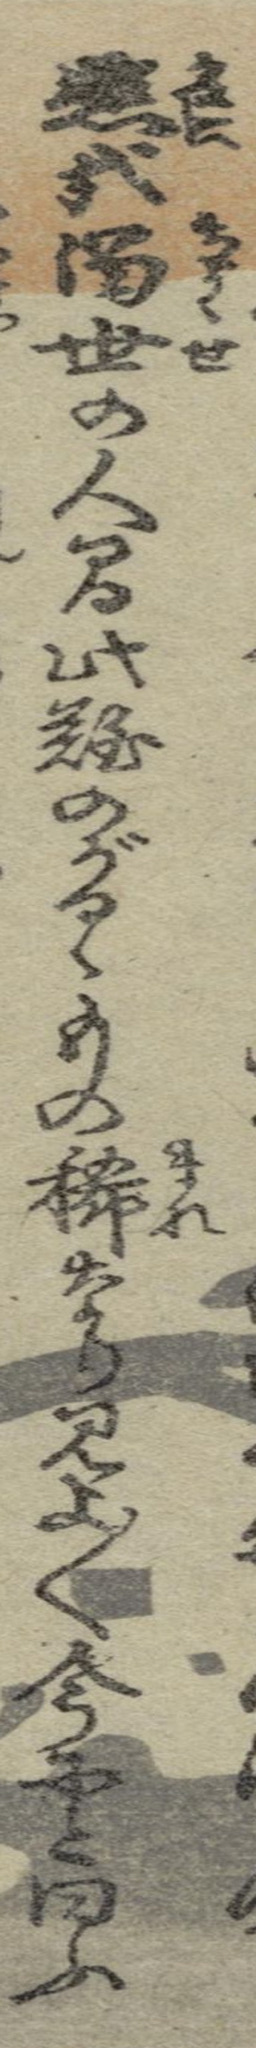悲哉濁世の人間此難のがるゝもの稀なり見よ〳〵今にと曰ふ
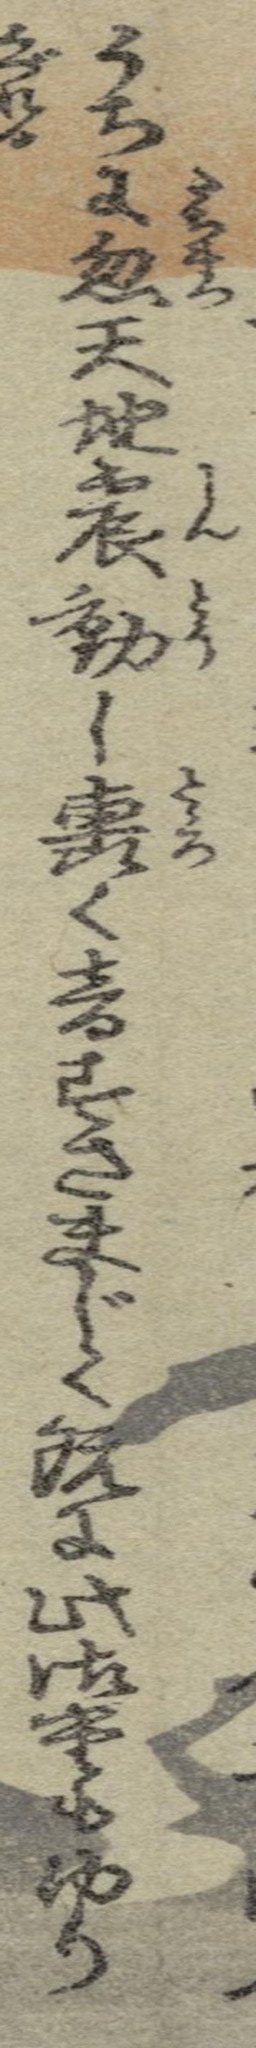うちに忽天地震動し轟く音すさまじく既に此御堂もゆり
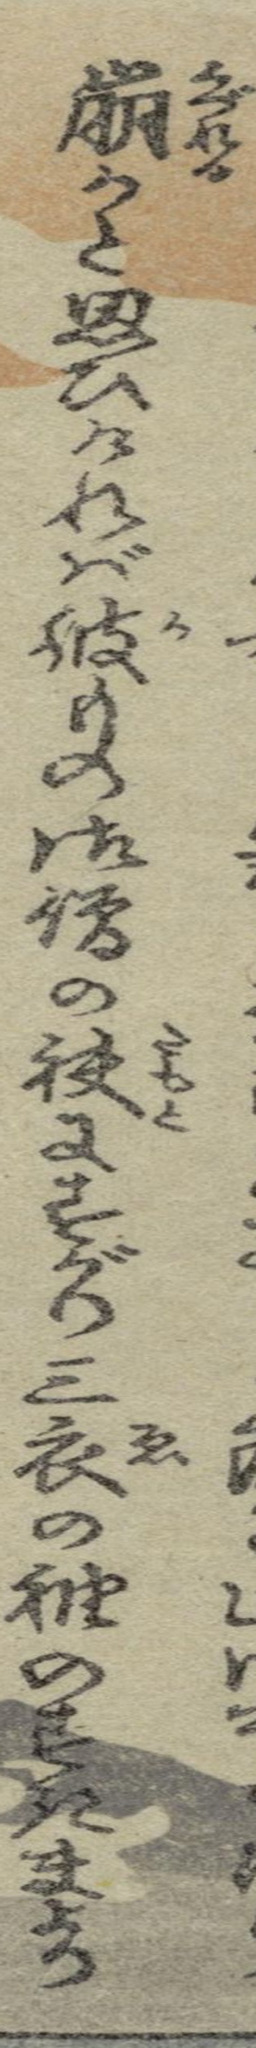崩かと思ひければ彼もの御僧の袂にすがり三衣の袖のすきまより
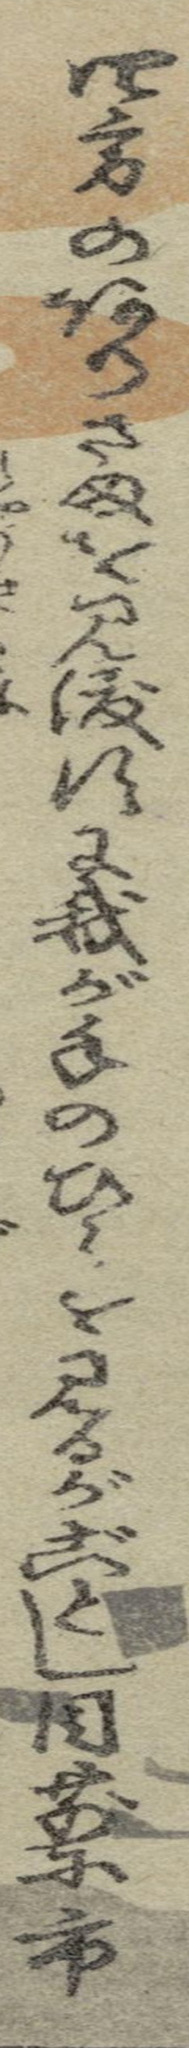四方のありさまを見渡すに我が手のひらを見るがごとし目前に市
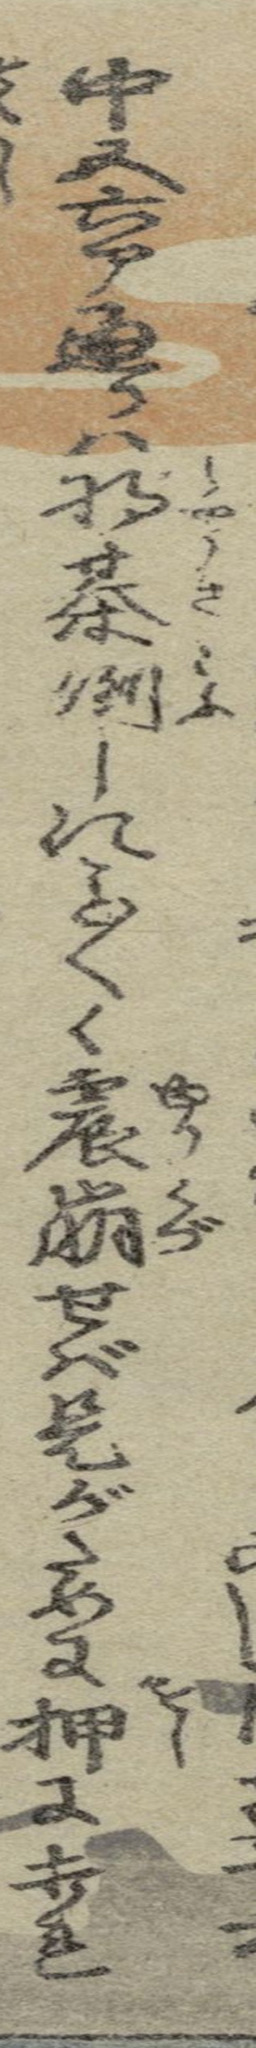中五六部通りは将棋倒しにこと〳〵く震崩せば是がために押に打れ
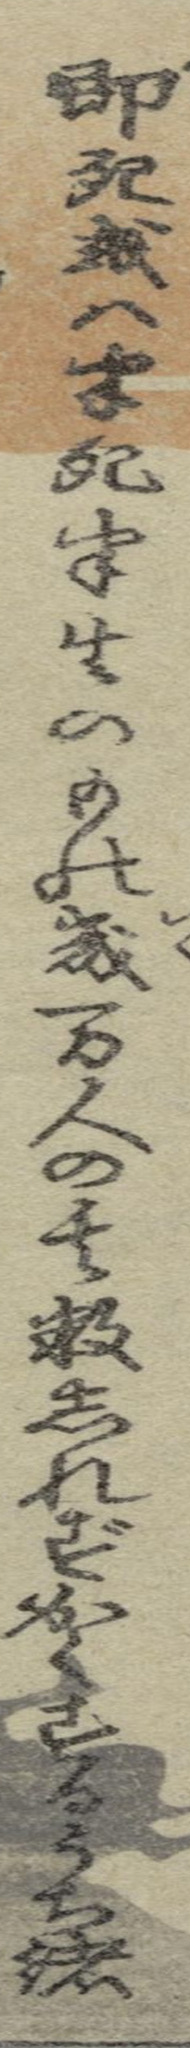即死或は半死半生のもの幾万人の其数しれずかくするうち諸
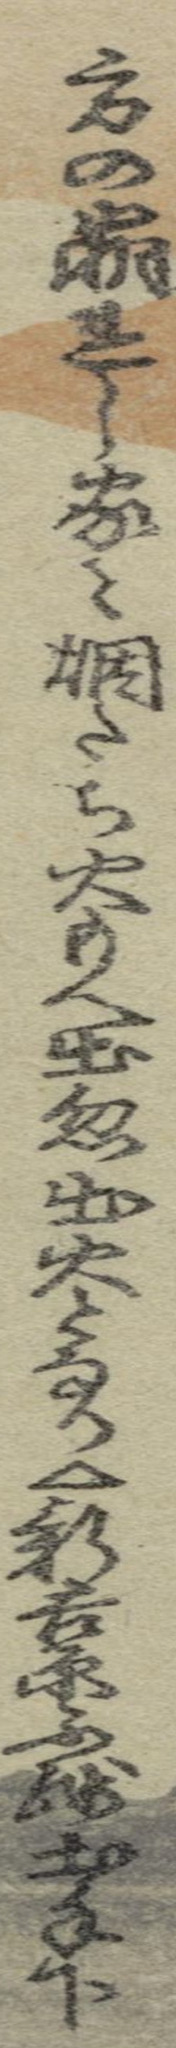方の崩れし家々烟たち火もへ出忽出火となり△新吉原不残土手下
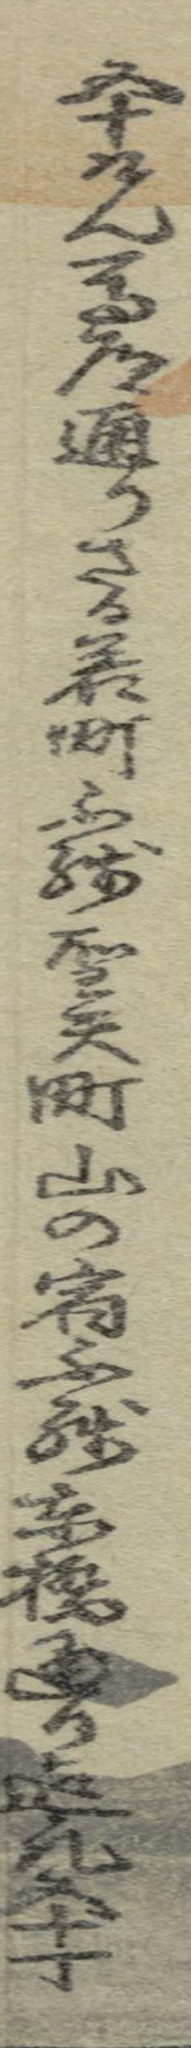五十けん馬道通りさる若町不残聖天町山の宿不残東橋通り迄凡五十丁
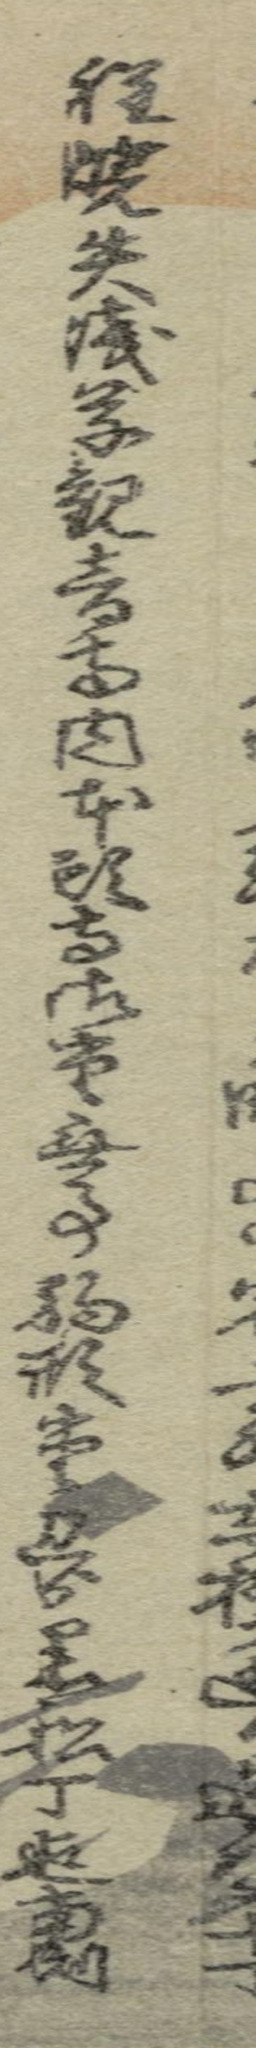程焼失浅草観音寺内本願寺御堂無事駒形堂辺ゟ黒松丁迄南側
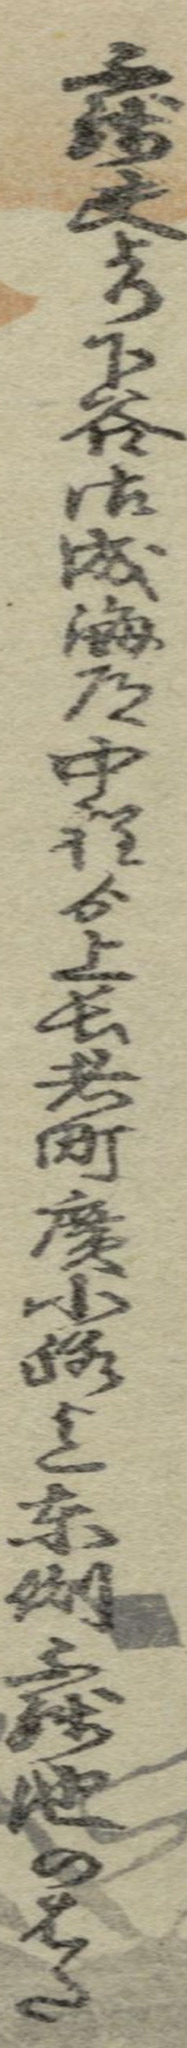不残夫より下谷御成海道中程ゟ上長者町広小路迄東側不残池のはた
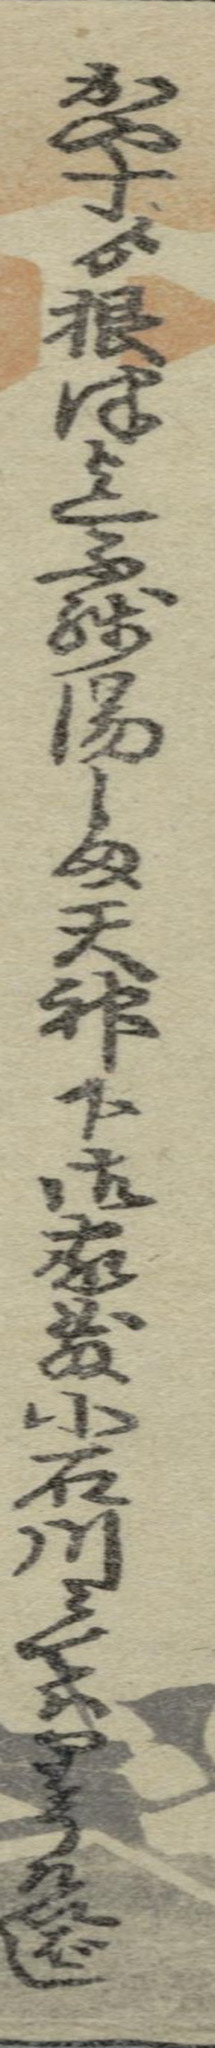かや丁ゟ根津迄不残湯しま天神下御屋敷小石川にてはりうけいばし
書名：江戸大地震大火方角附　世直り細見
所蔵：東京大学地震研究所図書室 Earthquake Research Institute Library, The University of Tokyo, JAPAN
